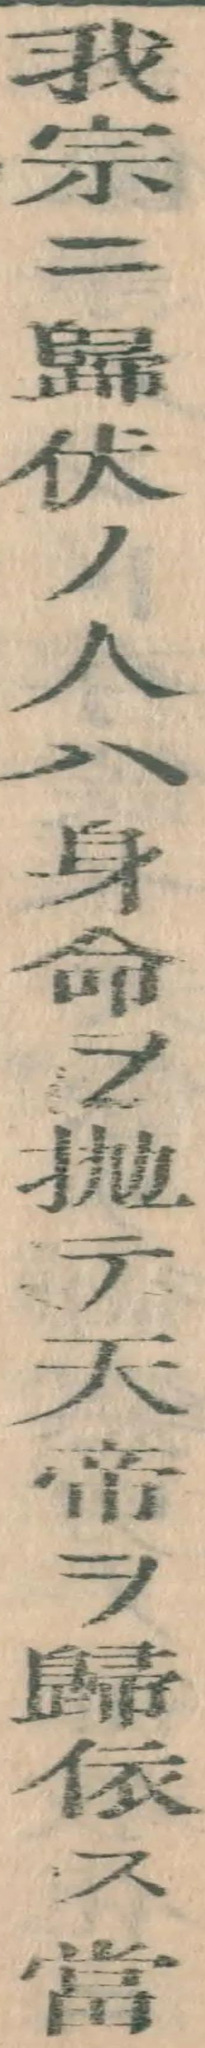我宗ニ帰伏ノ人ハ身命ヲ抛テ天帝ヲ帰依ス当
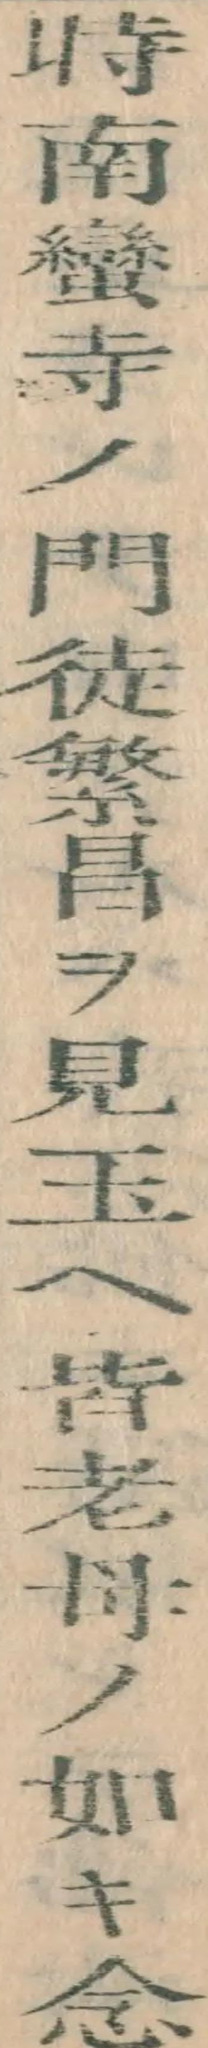時南蛮寺ノ門徒繁昌ヲ見玉ヘ皆老母ノ如キ念
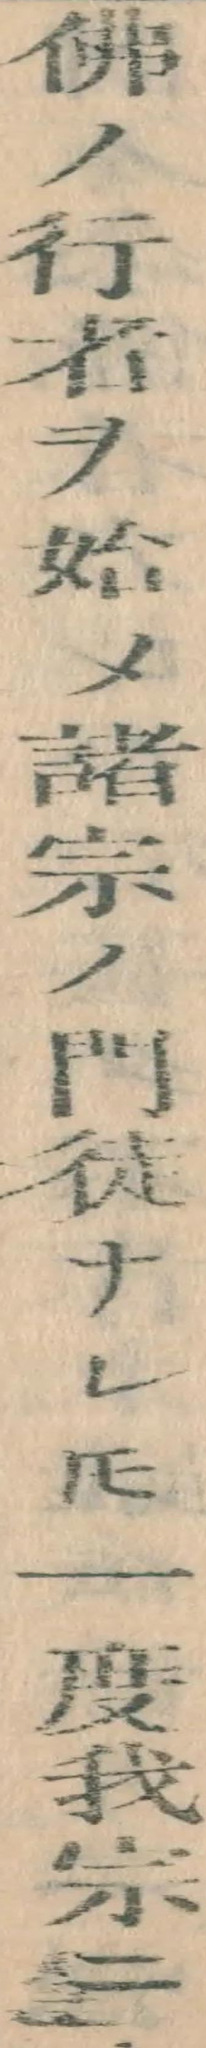仏ノ行者ヲ始メ諸宗ノ門徒ナレトモ一度我宗ニ
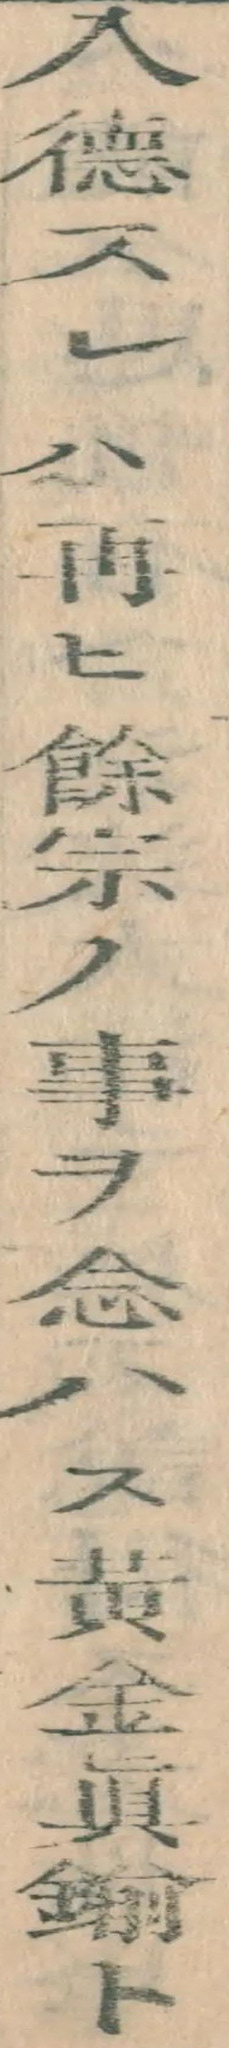入徳スレハ再ヒ余宗ノ事ヲ念ハス黄金真鍮ト
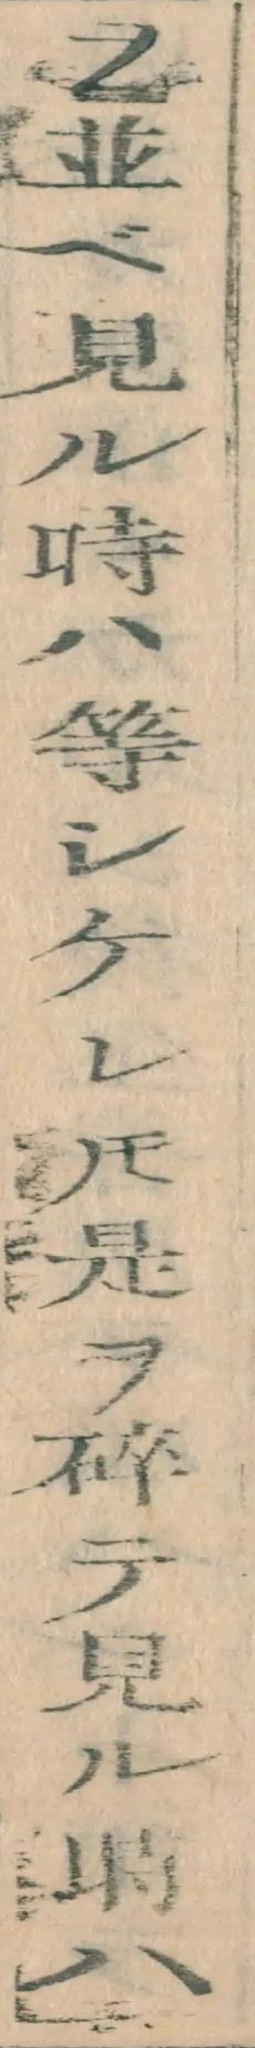ヲ並ベ見ル時ハ等シケレトモ是ヲ砕テ見ル時ハ

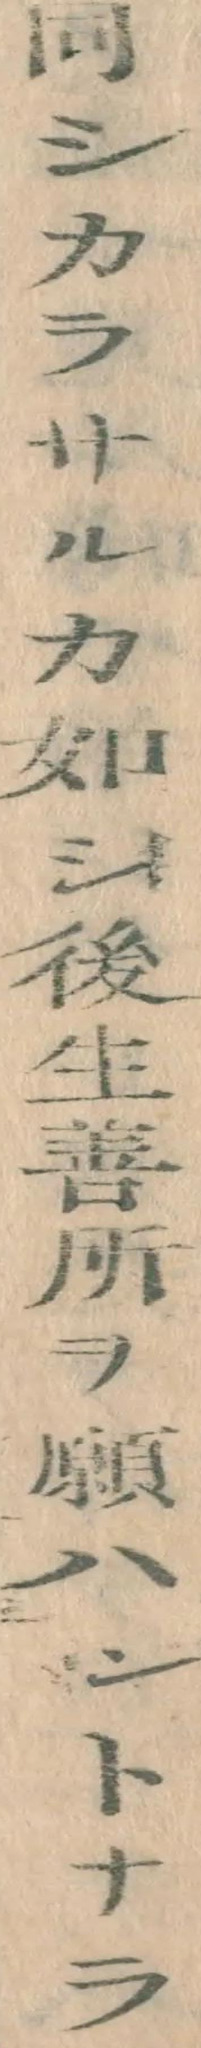同シカラサルカ如シ後生善所ヲ願ハントナラ
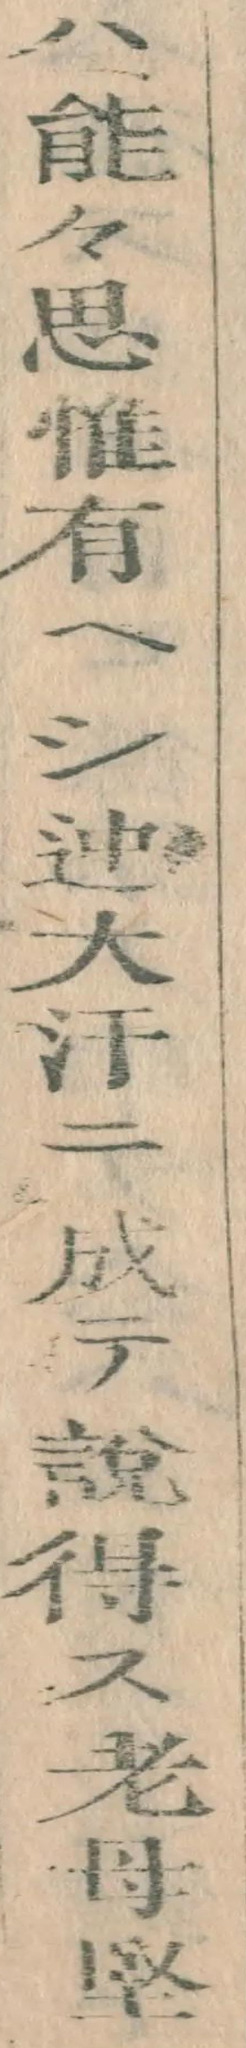ハ能々思惟有ヘシ迚大汗ニ成テ説得ス老母堅
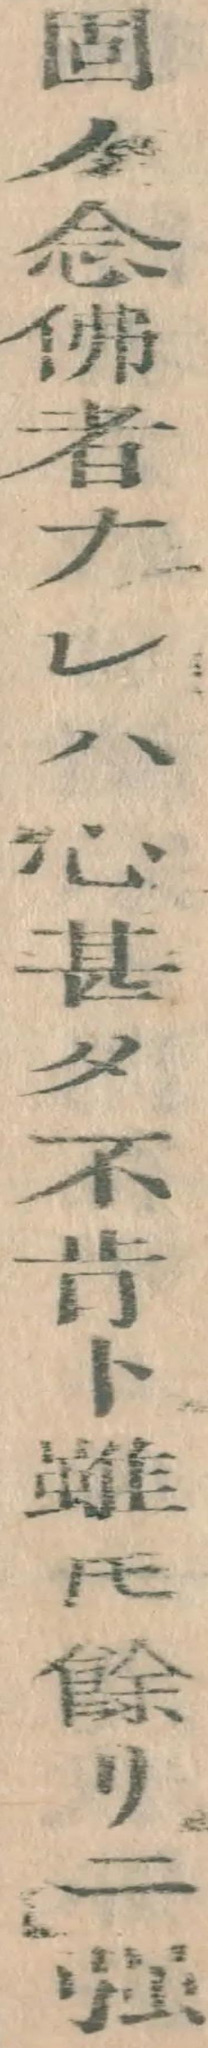固ノ念仏者ナレハ心甚タ不肯ト雖トモ余リニ強
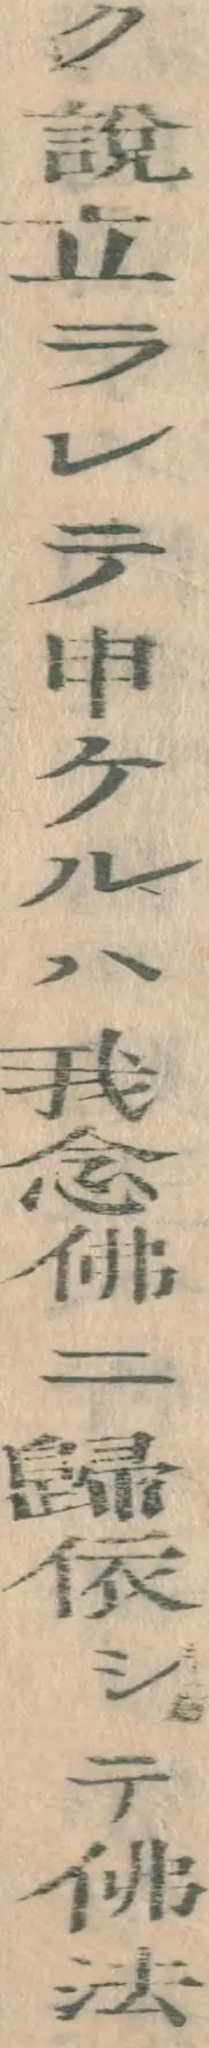ク説立ラレテ申ケルハ我念仏ニ帰依シテ仏法
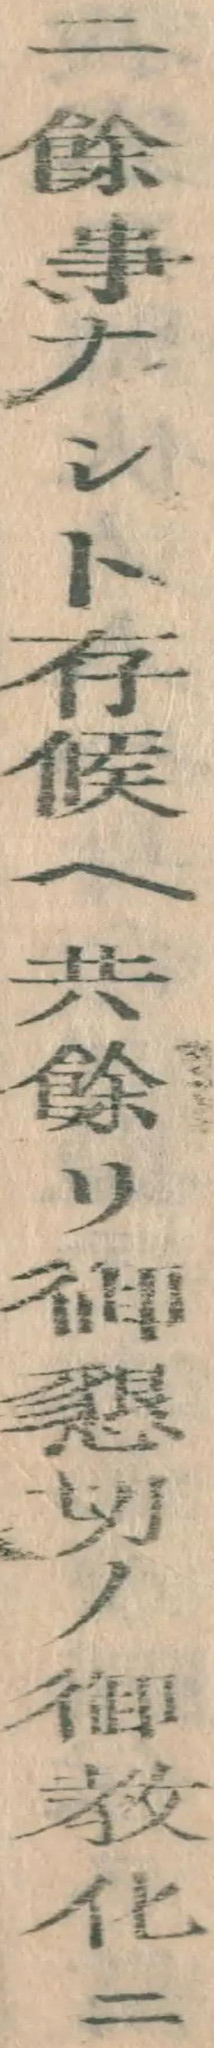ニ余事ナシト存候ヘ共余リ御懇切ノ御教化ニ
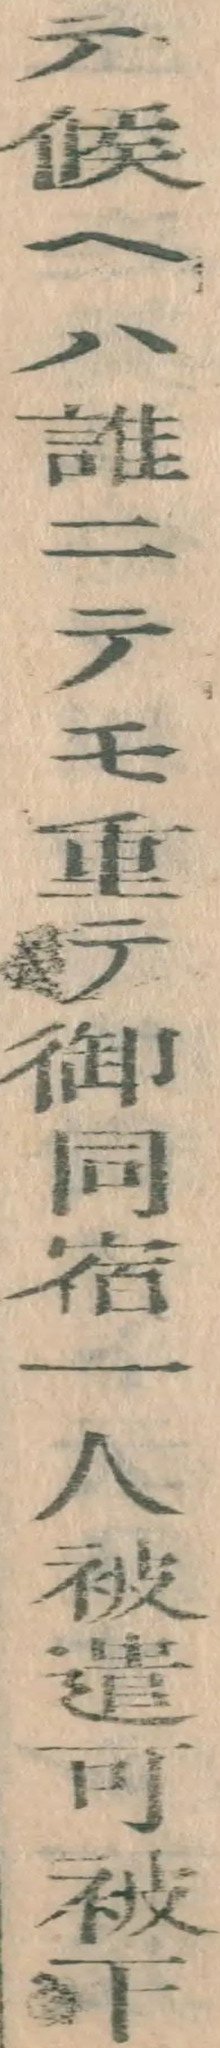テ候ヘハ誰ニテモ重テ御同宿一人被遣可被下
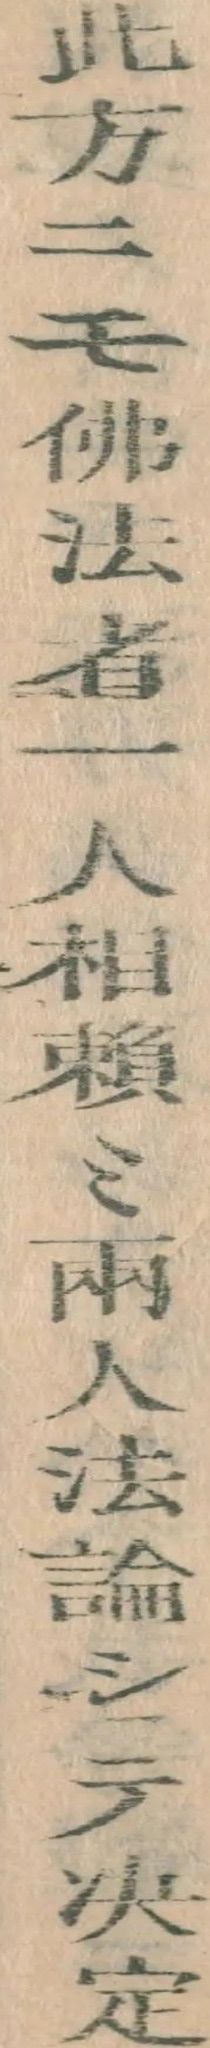此方ニモ仏法者一人相頼ミ両人法論シテ決定
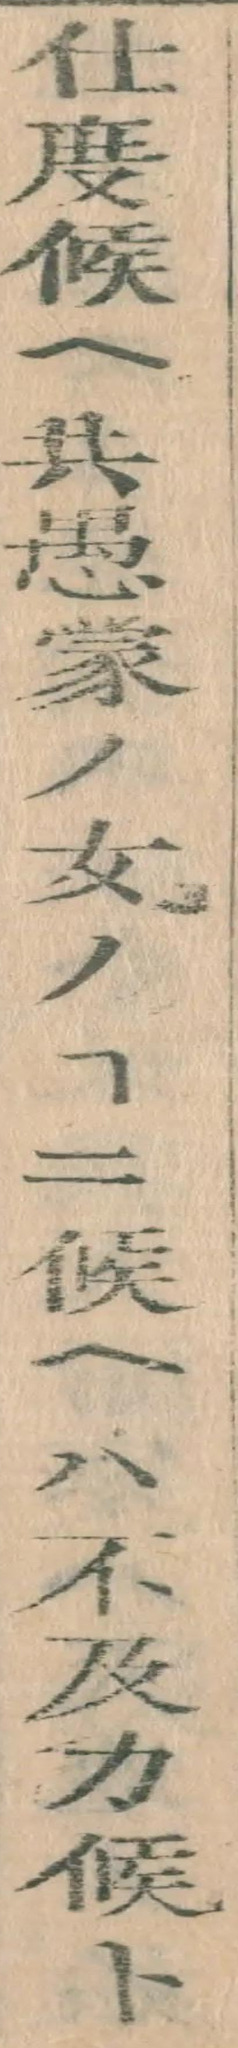仕度候ヘ共愚蒙ノ女ノヿニ候ヘハ不及力候ト
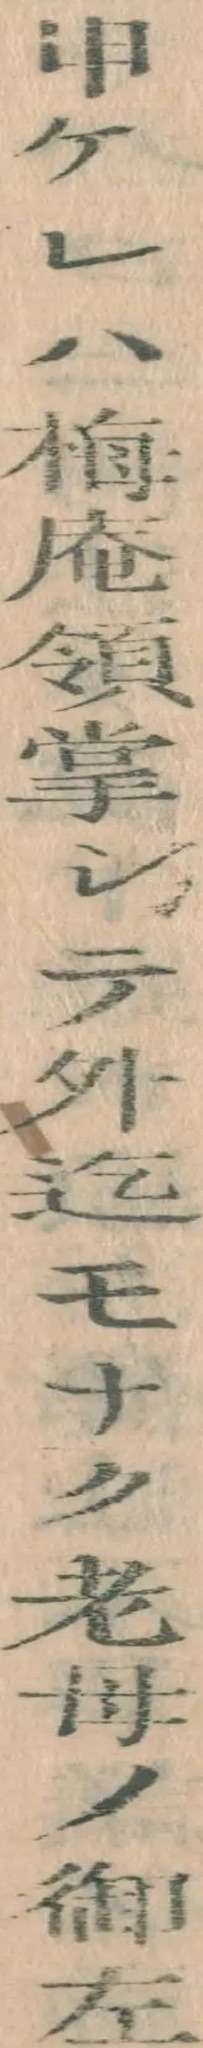申ケレハ梅庵領掌シテ外迄モナク老母ノ御左
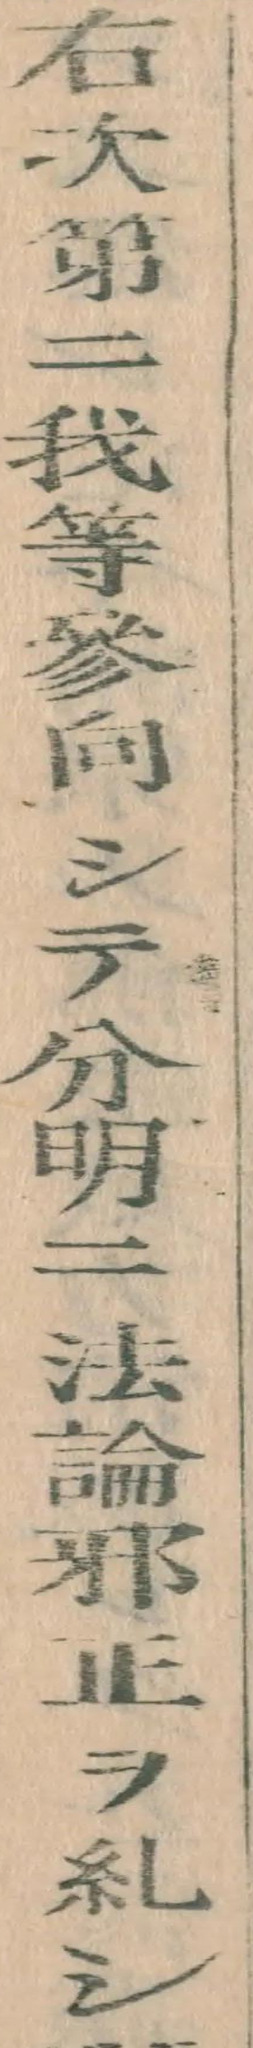右次第ニ我等参向シテ分明ニ法論邪正ヲ糺シ
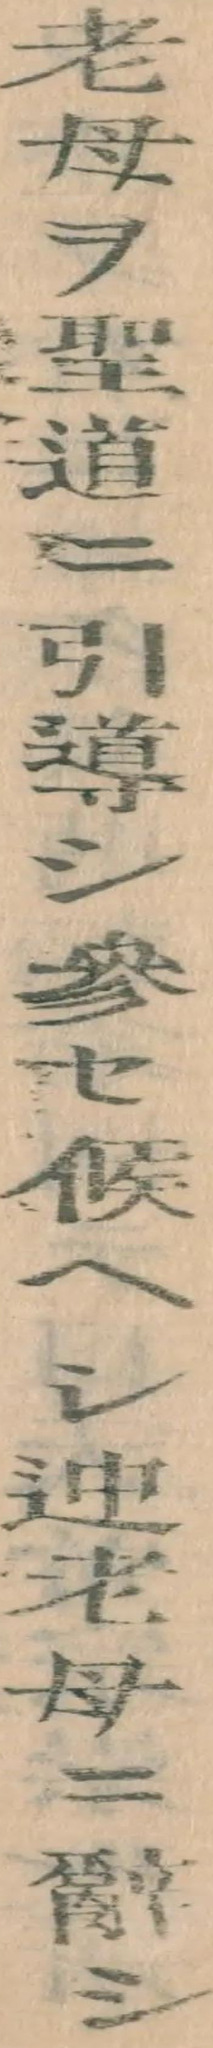老母ヲ聖道ニ引導シ参セ候ヘシ迚老母ニ辞シ
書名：南蛮寺興廃記
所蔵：国立国会図書館 National Diet Library, JAPAN
